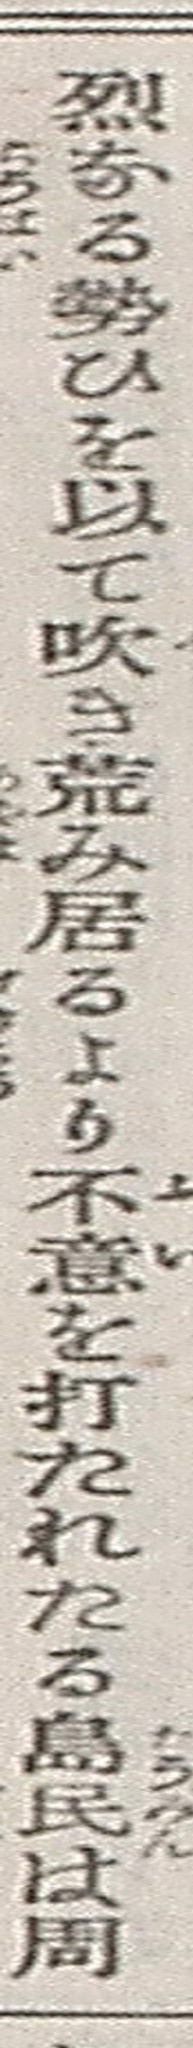烈なる勢ひを以て吹き荒み居るより不意を打たれたる島民は周
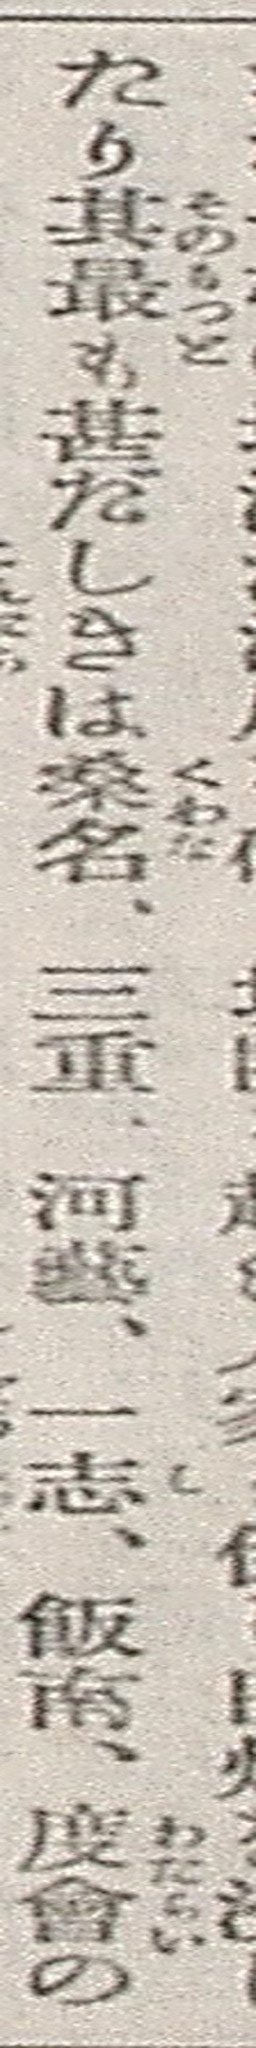たり其最も甚だしきは桑名、三重、河芸、一志、飯南、度会の
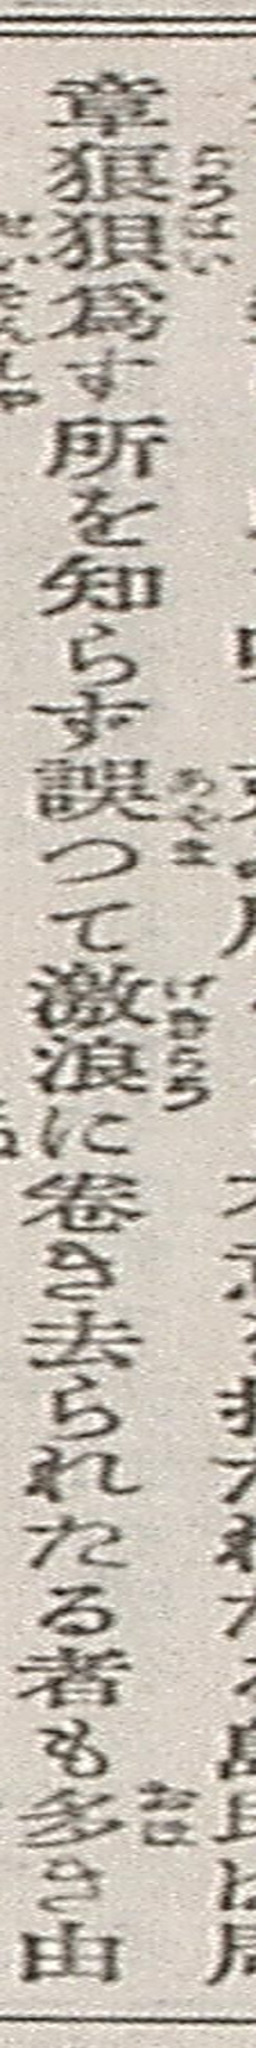章狼狽為す所を知らず誤つて激浪に巻き去られたる者も多き由
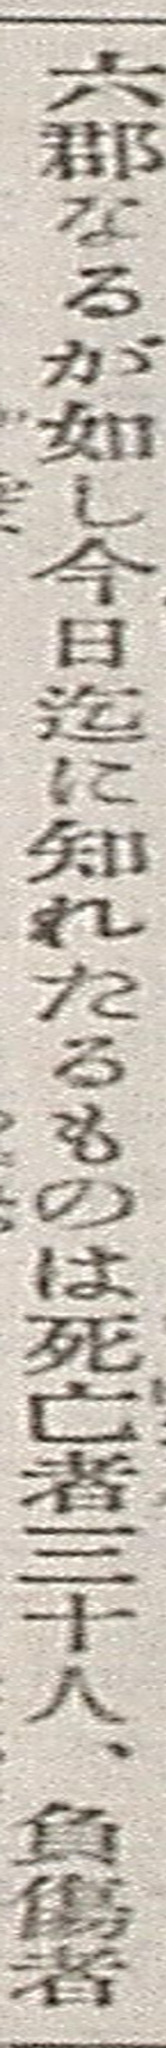六郡なるが如し今日迄に知れたるものは死亡者三十人、負傷者
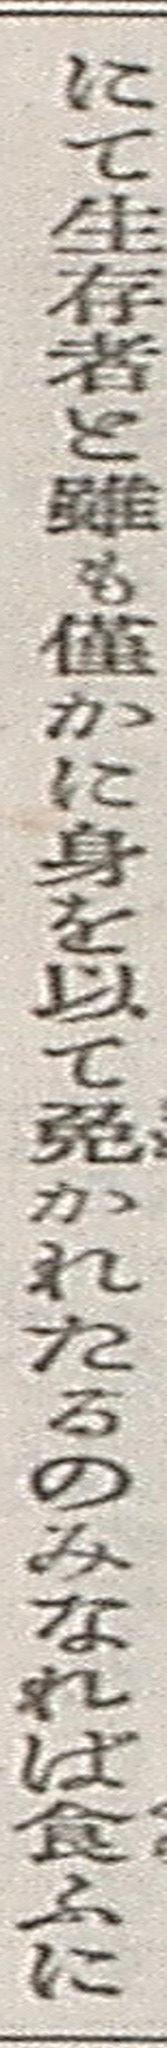にて生存者と雖も僅かに身を以て免かれたるのみなれば食ふに
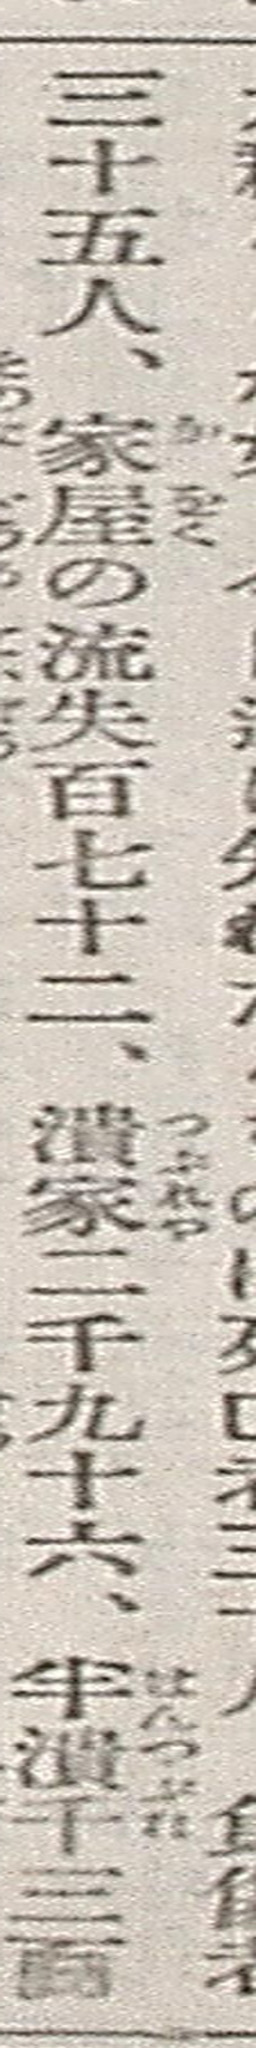三十五人、家屋の流失百七十二、潰家二千九十六、半潰千三百
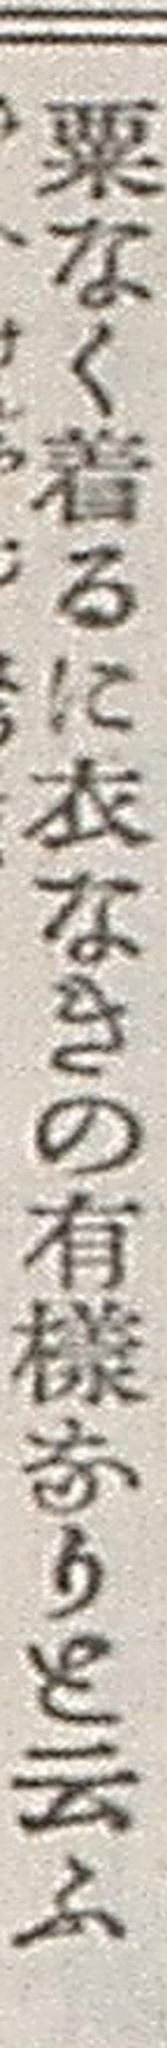粟なく着るに衣なきの有様なりと云ふ
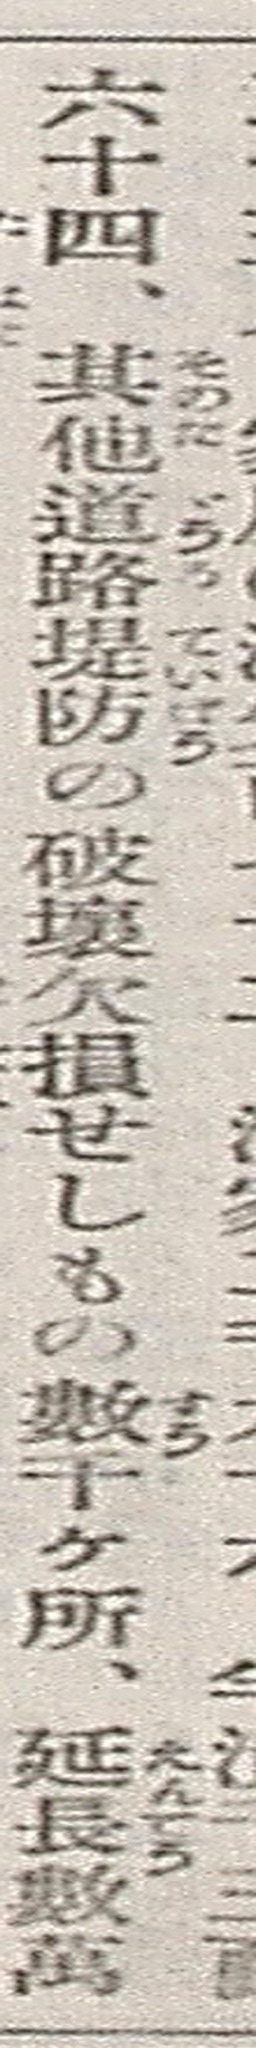六十四、其他道路堤防の破壊欠損せしもの数千ヶ所、延長数万
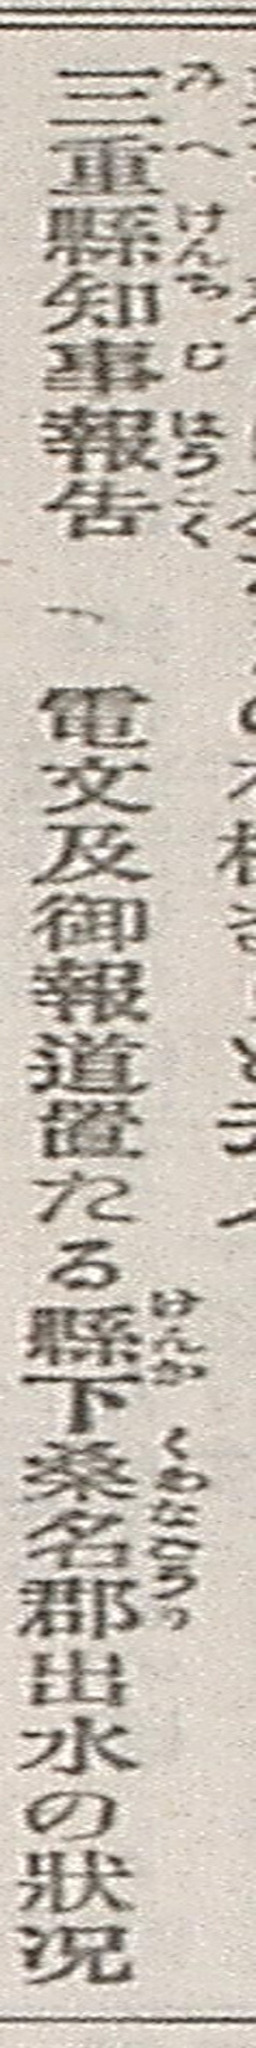三重県知事報告電文及御報道置たる県下桑名郡出水の状況
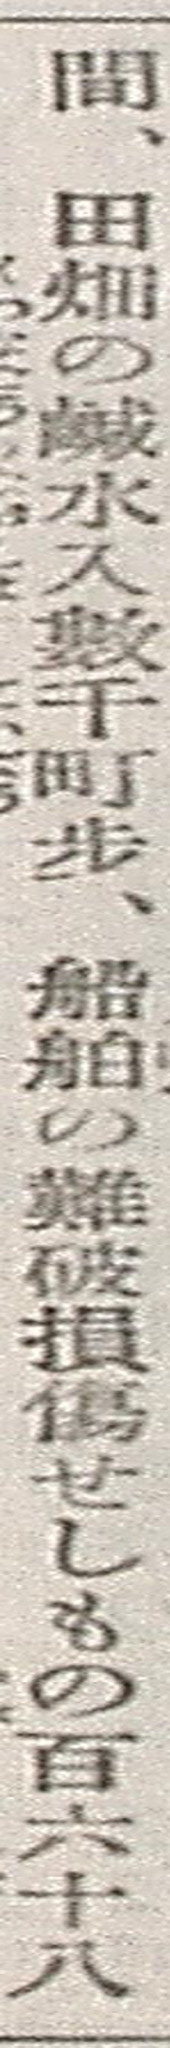間、田畑の鹹水入数千町歩、船舶の難破損傷せしもの百六十八
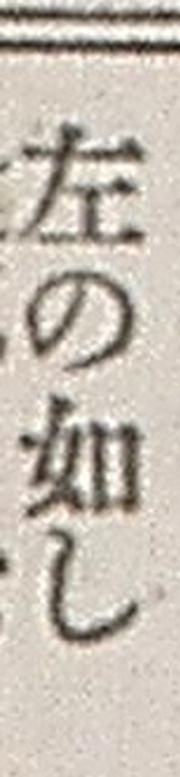左に如し
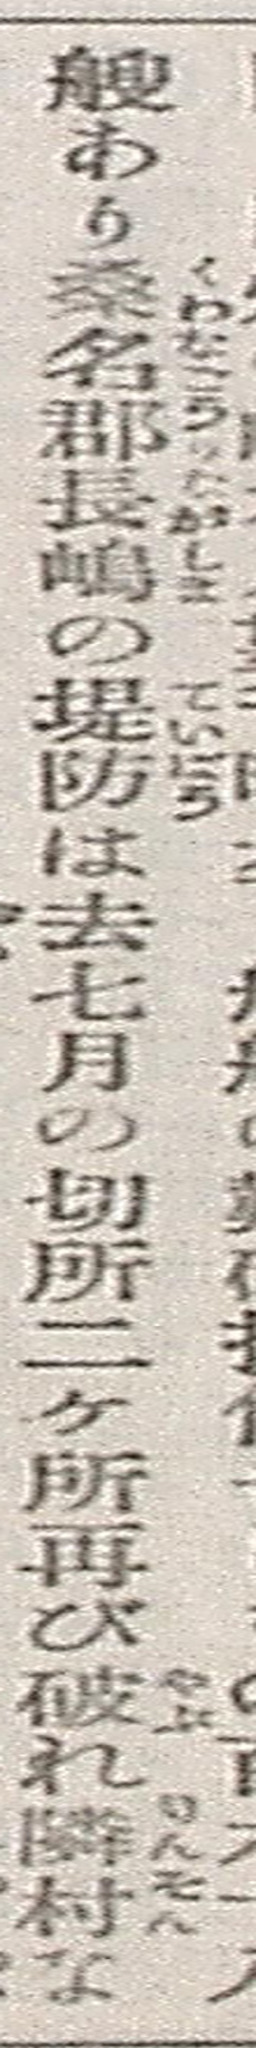艘あり桑名郡長嶋の堤防は去七月の切所二ヶ所再び破れ隣村な
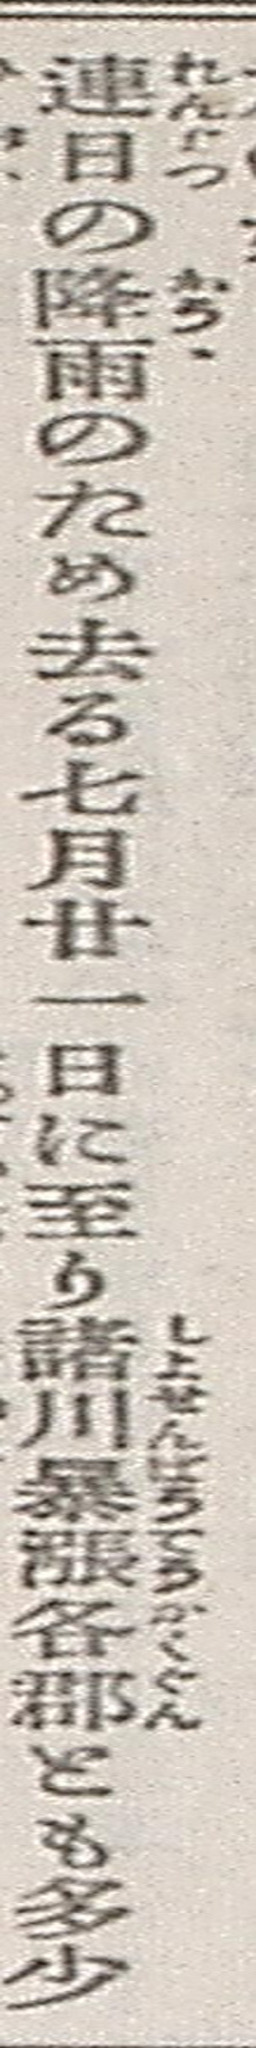連日の降雨のため去る七月廿一日に至り所川暴漲各郡とも多少
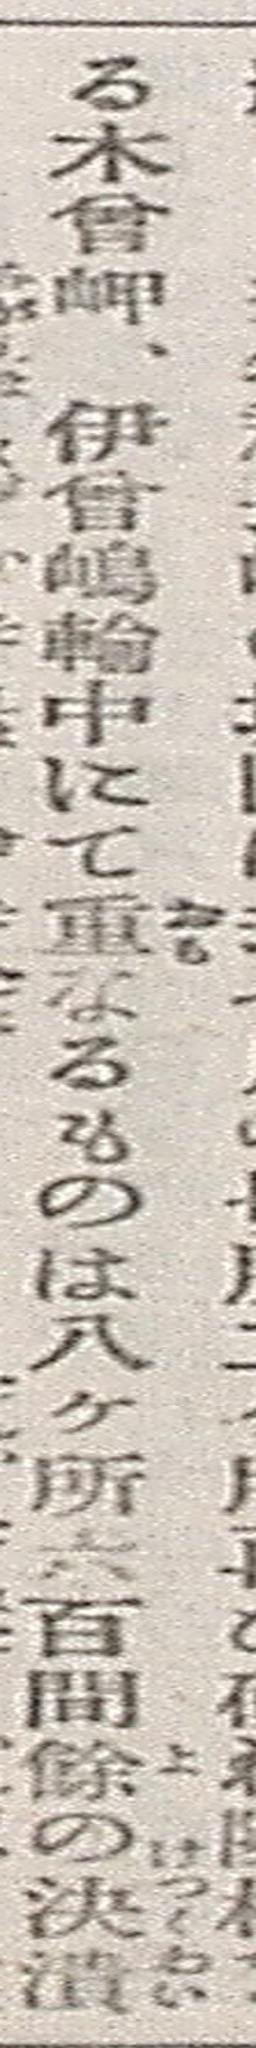る木曽岬、伊曾嶋輪中にて重なるものは八ヶ所六百間餘の决潰
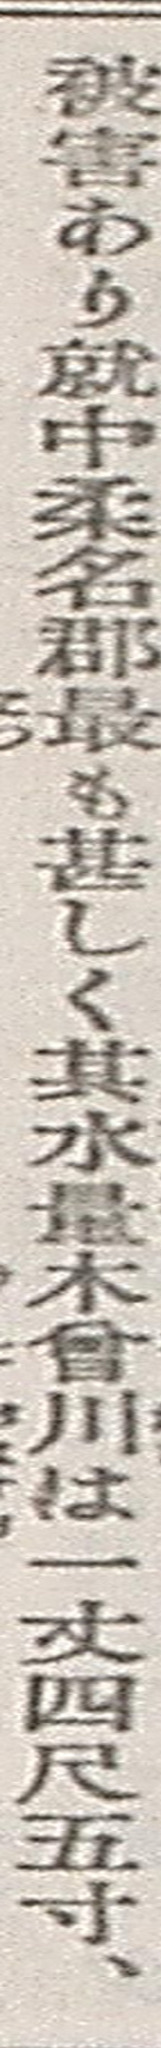被害あり就中柔名郡最も甚しく其水量木曽川は一丈四尺五寸、
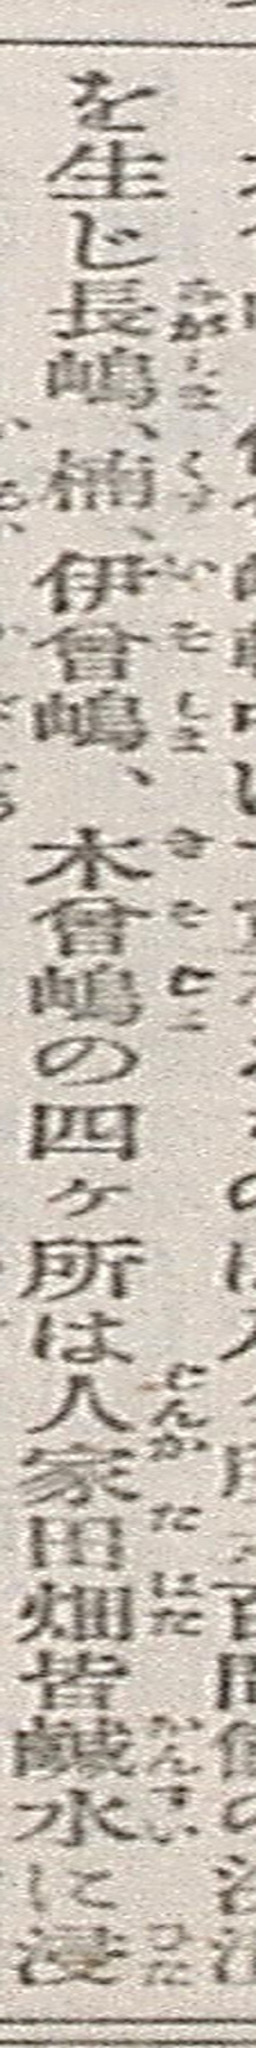を生じ長嶋、楠、伊曾嶋、木曽嶋の四ヶ所は人家田畑皆鹹水に浸
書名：風俗畫報臨時増刊第百二十八號　洪水被害録（下）
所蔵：東京大学地震研究所図書室 Earthquake Research Institute Library, The University of Tokyo, JAPAN
